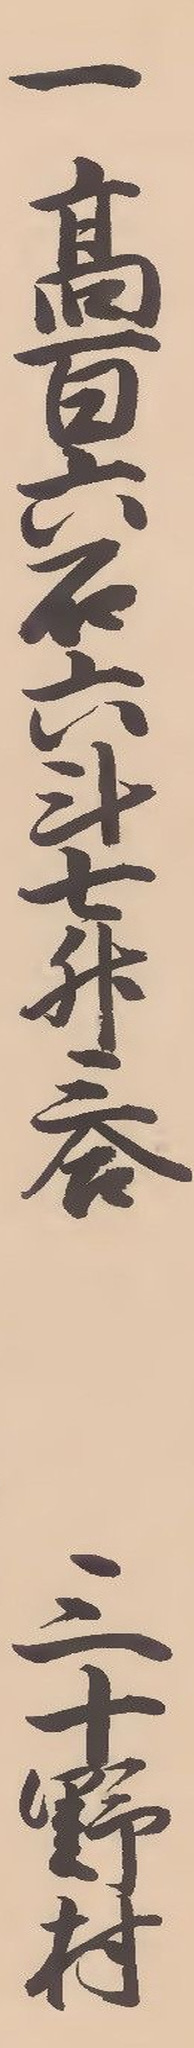一高百六石六斗七升三合三十野村
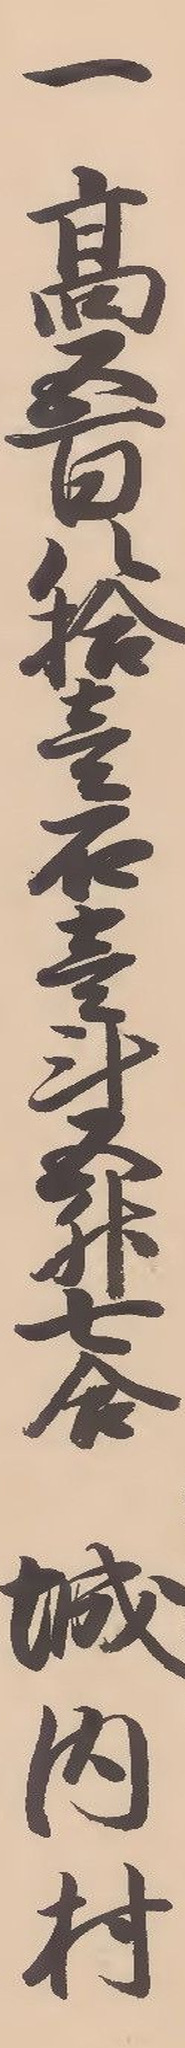一高五百八拾壱石壱斗五升七合城内村
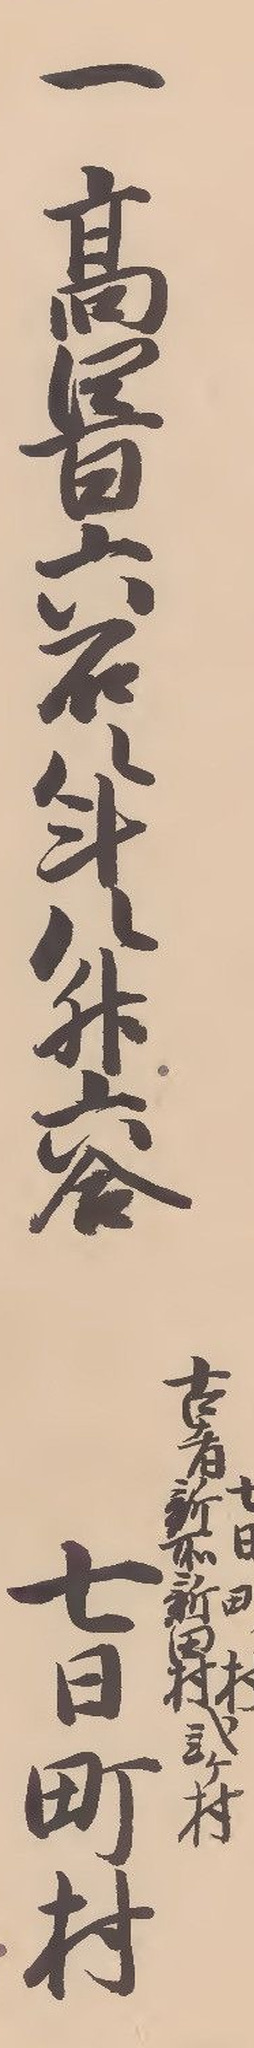一高四百六石八斗八升六合七日町村
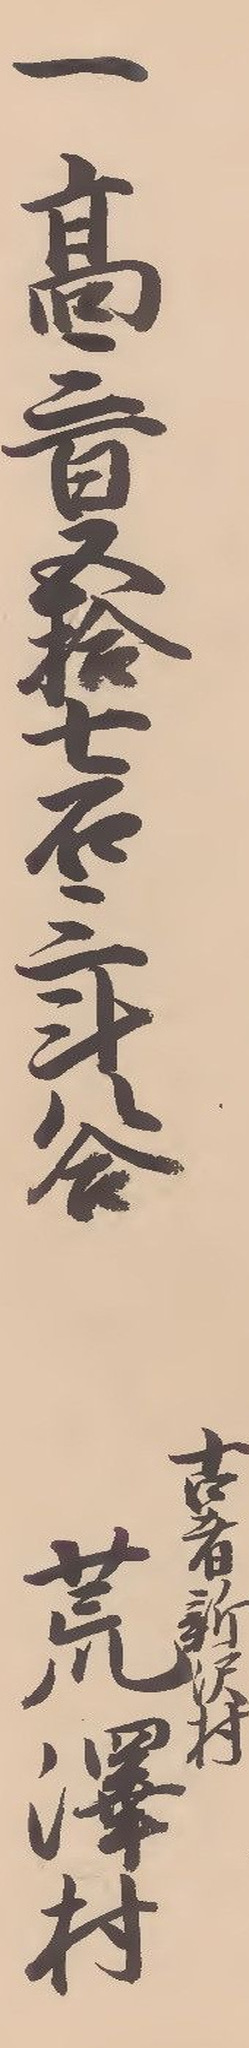一高三百五拾七石三斗八合荒沢村

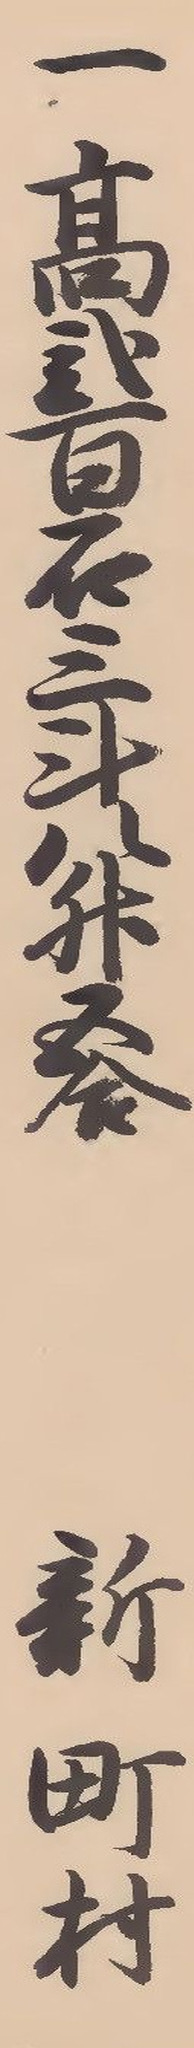一高弐百石三斗八升五合新町村
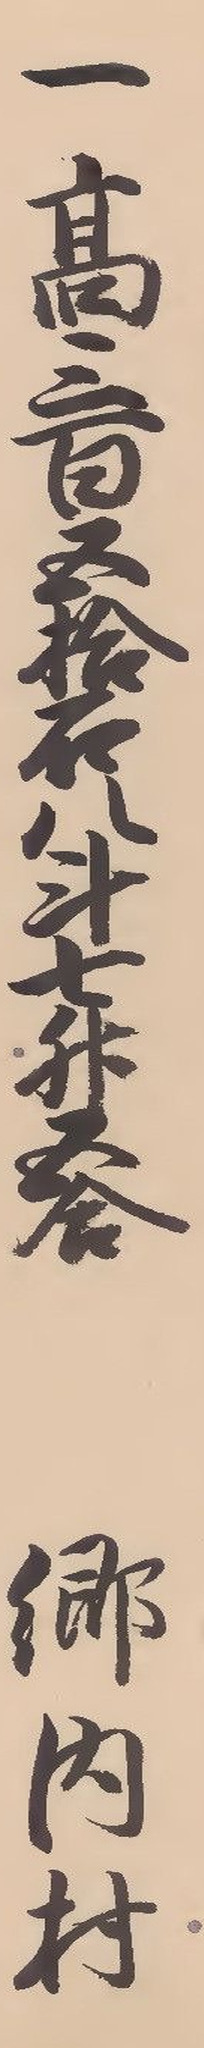一高三百五拾石八斗七升五合郷内村
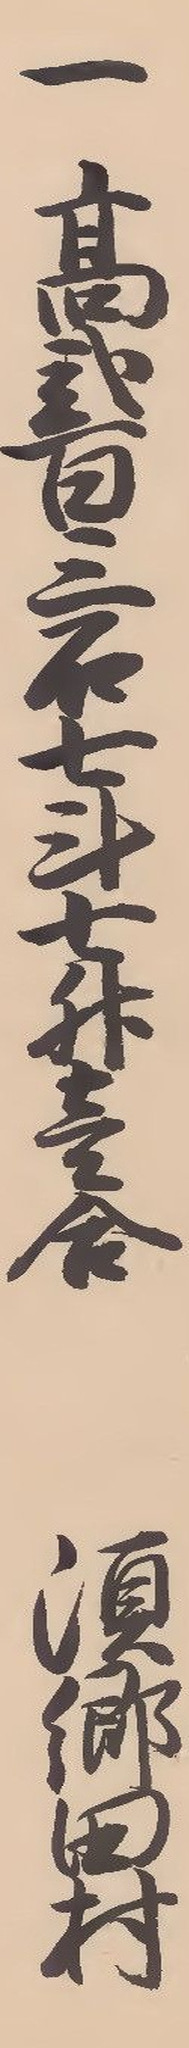一高弐百三石七斗七升壱合須郷田村
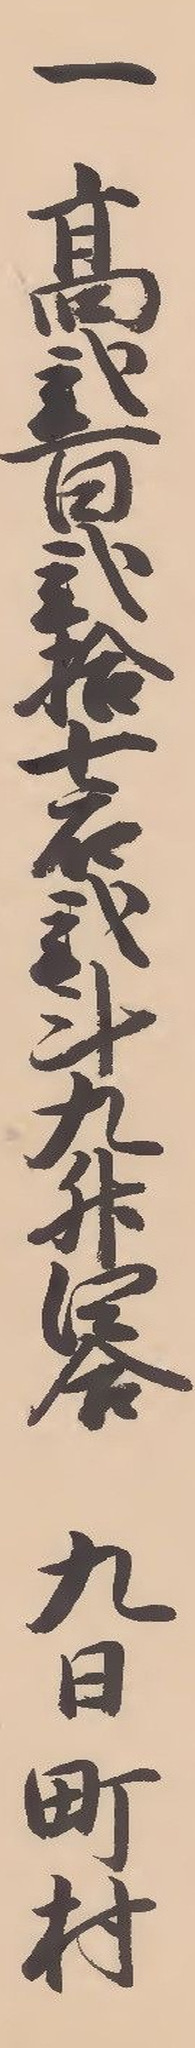一高弐百弐拾七石弐斗九升四合九日町村
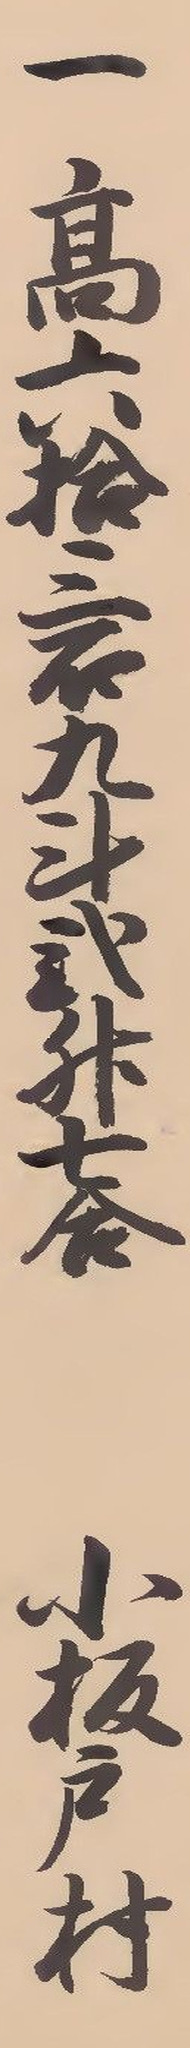一高六拾三石九斗弐升七合小板戸村
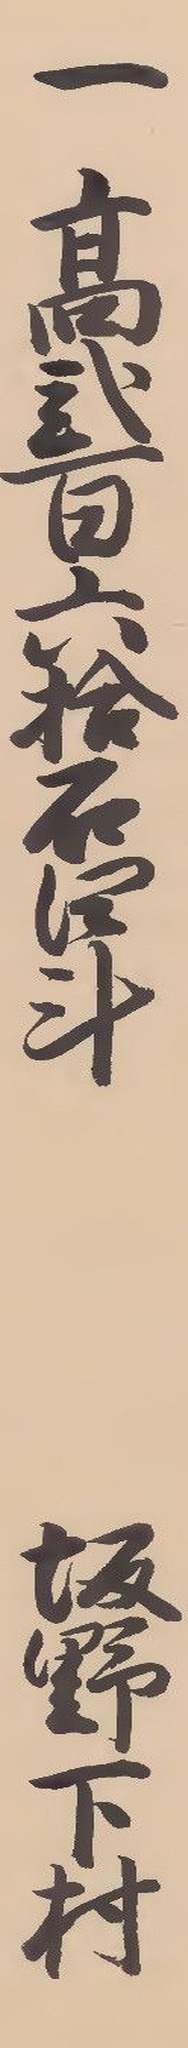一高弐百六拾石四斗坂野下村
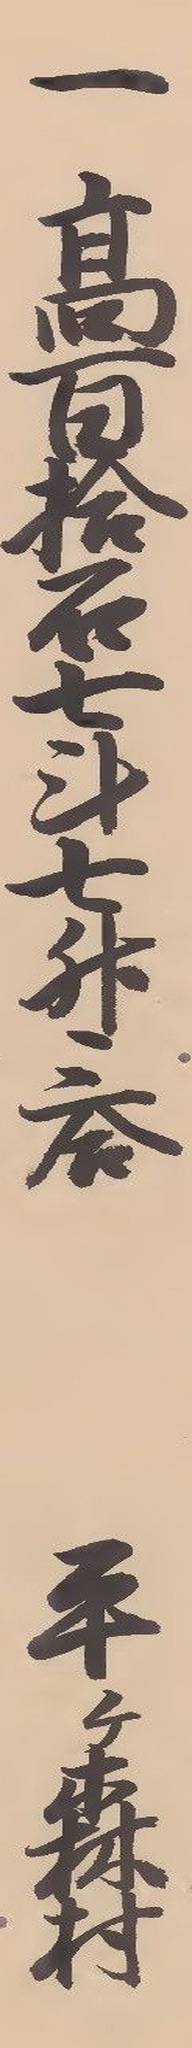一高百拾石七斗七升三合平ヶ森村

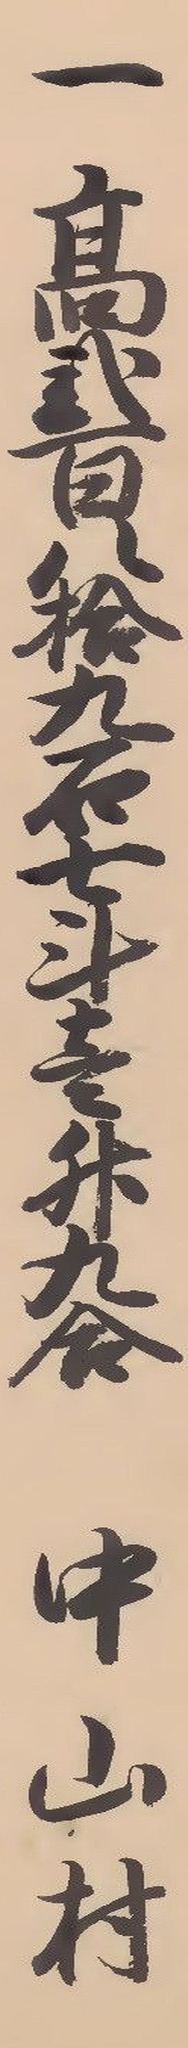一高弐百八拾九石七斗壱升九合中山村
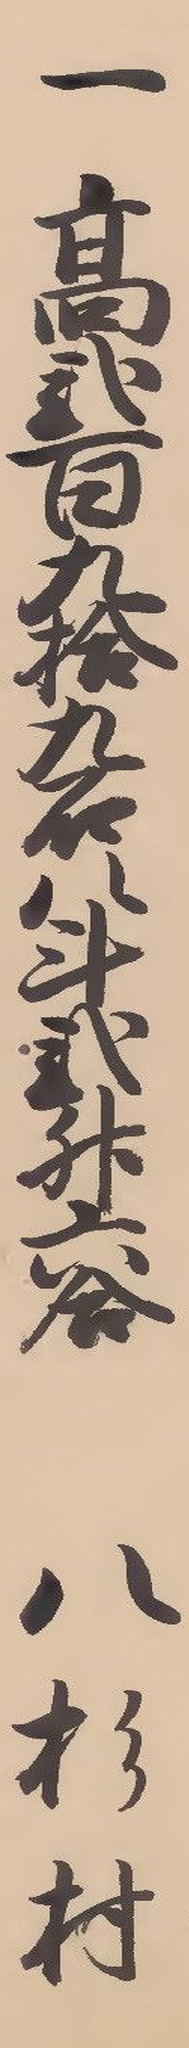一高弐百九拾九石八斗弐升六合八杉村
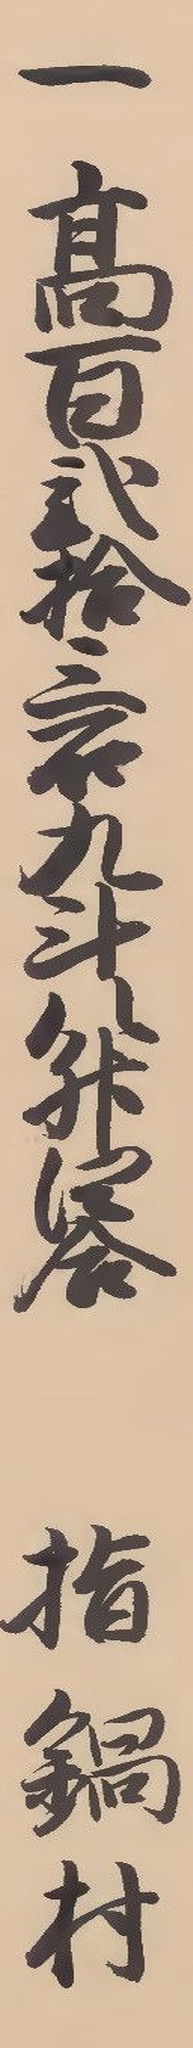一高百弐拾三石九斗八升四合指鍋村
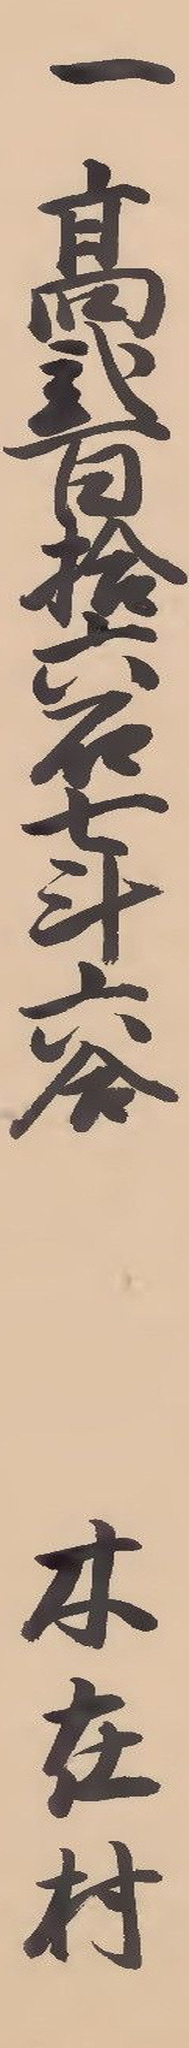一高弐百拾六石七斗六合木在村
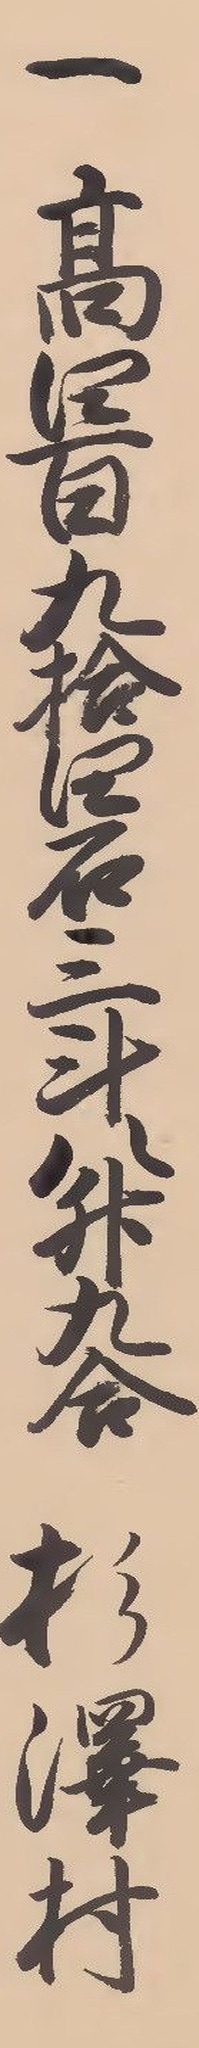一高四百九拾四石三斗八升九合杉沢村
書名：出羽国郷帳　５
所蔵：国立公文書館 National Archives of Japan
